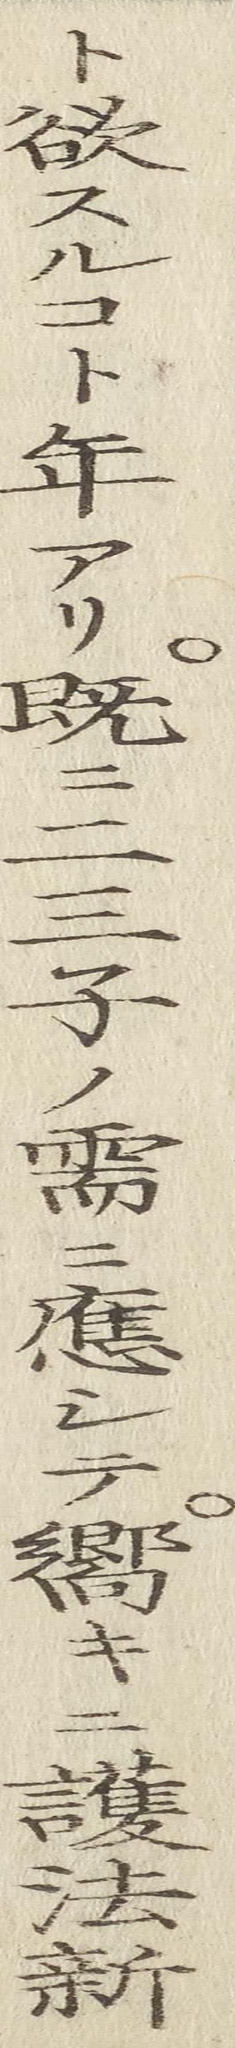ト欲スルコト年アリ。既ニ二三子ノ需ニ応シテ。嚮キニ護法新
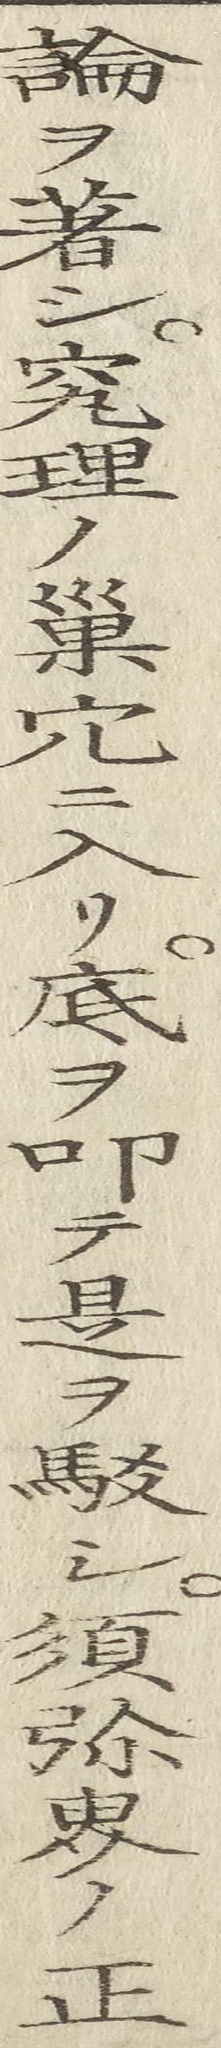論ヲ著シ。究理ノ巣穴ニ入リ。底ヲ叩テ是ヲ駁シ。須弥界ノ正
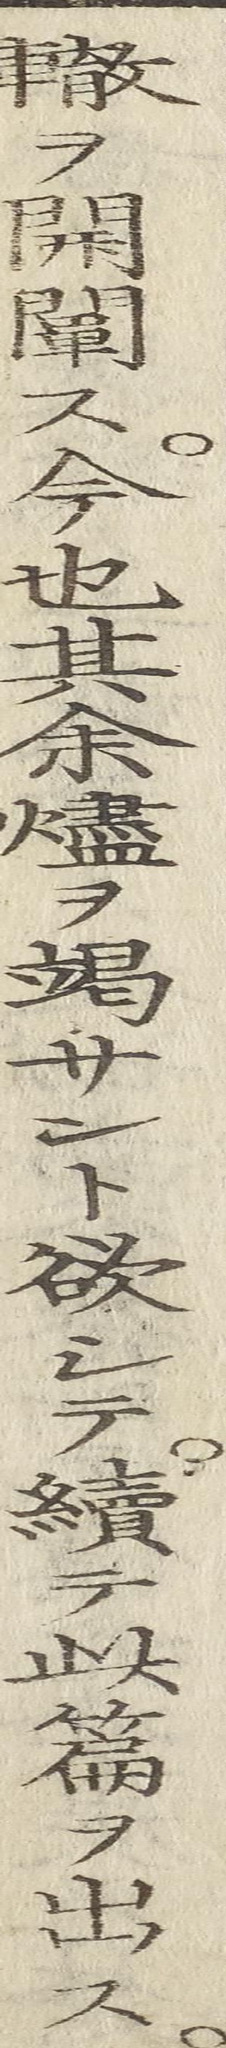轍ヲ開闡ス。今也其余燼ヲ竭サント欲シテ。続テ此篇ヲ出ス。

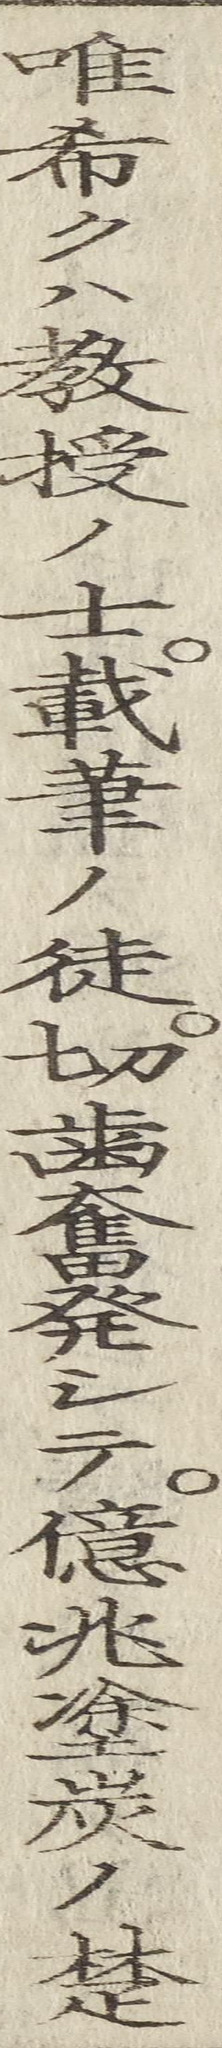唯希クハ教授ノ士。載筆ノ徒。切歯奮発シテ。億兆塗炭ノ礎
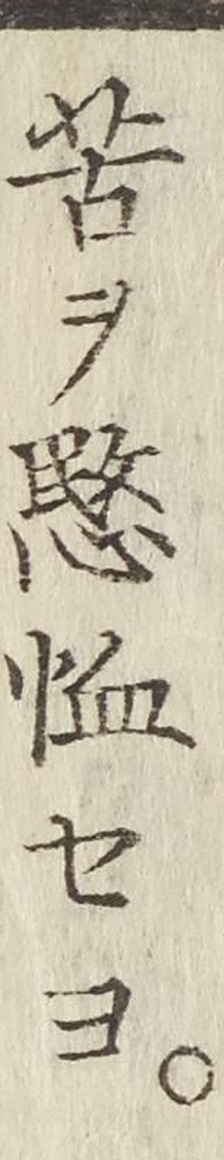苦ヲ愍恤セヨ。
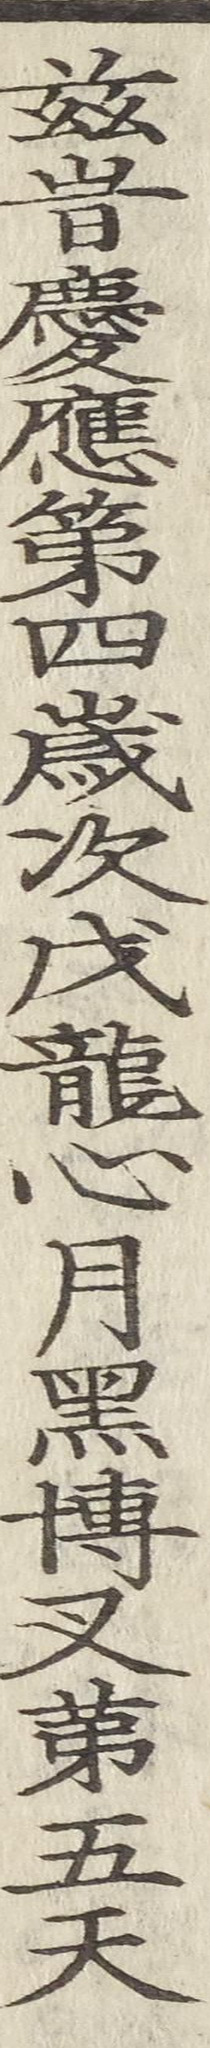茲旹慶応第四歳次戊龍心月黒博叉第五天
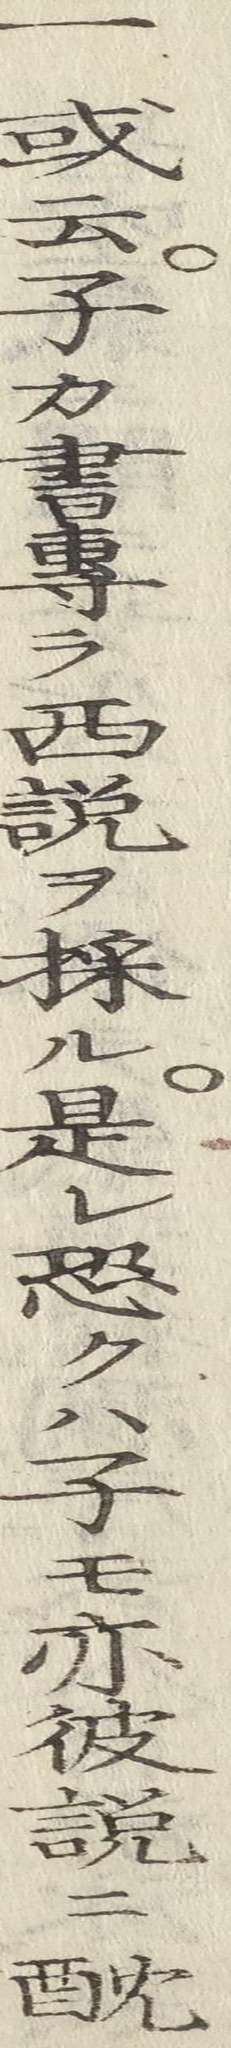一或云。子カ書専ラ西説ヲ採ル。是レ恐クハ子モ亦彼説ニ酖
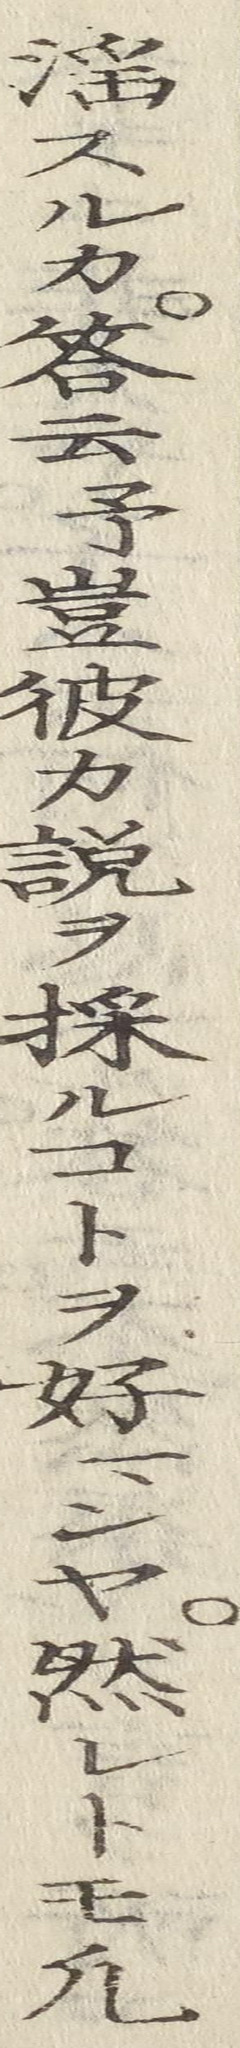滛スルカ。答云予豈彼カ説ヲ採ルコトヲ好マンヤ。然レトモ凡
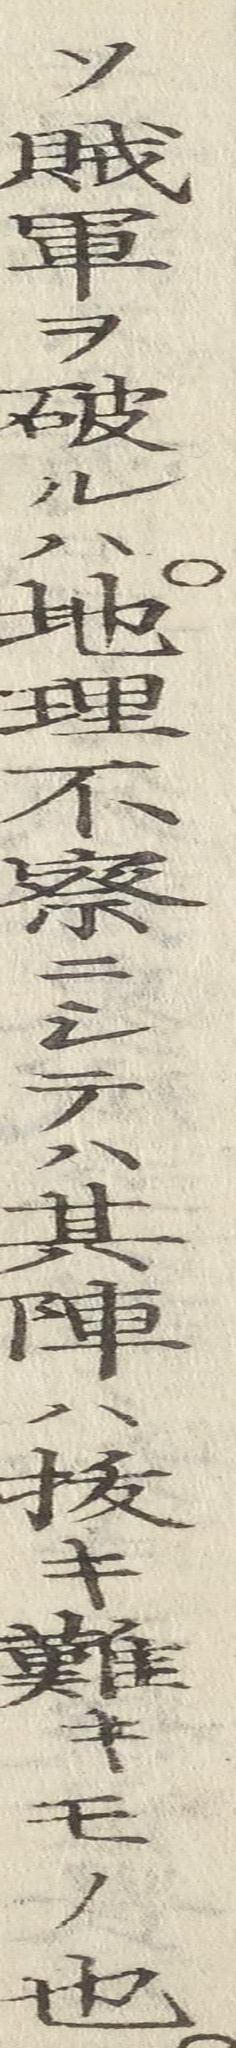ソ賊軍ヲ破ルハ。地理不察ニシテハ其陣ハ抜キ難キモノ也。
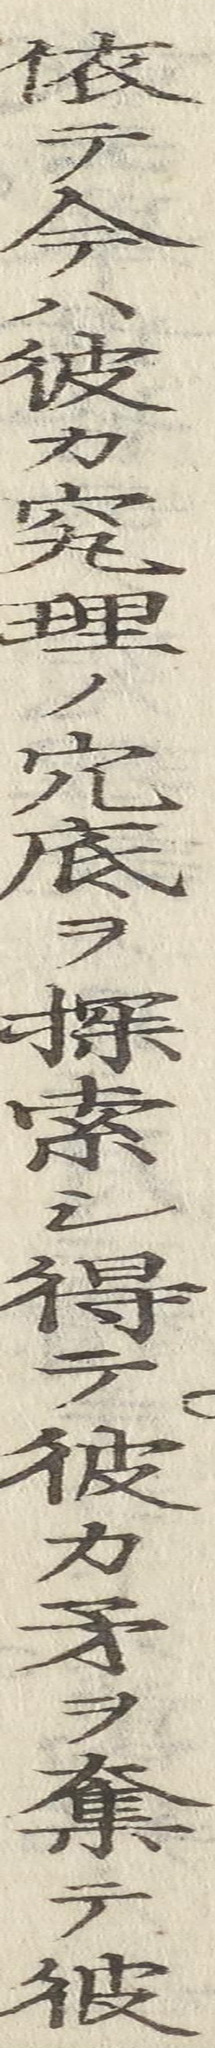依テ今ハ彼カ究理ノ穴底ヲ探索シ得テ。彼カ矛ヲ奪テ彼
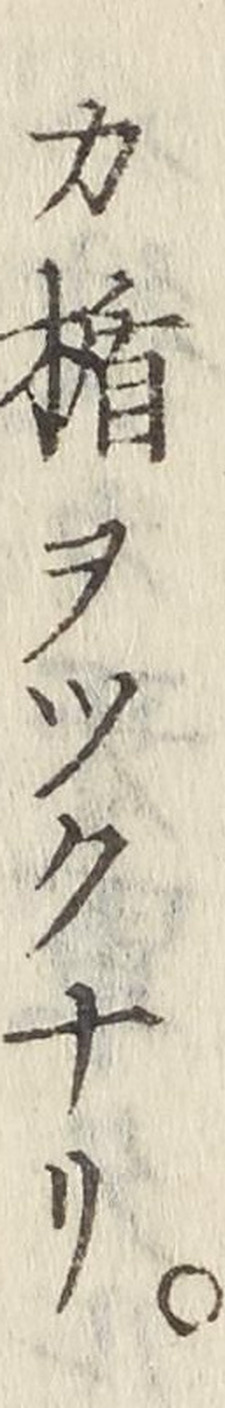カ楯ヲツクナリ。
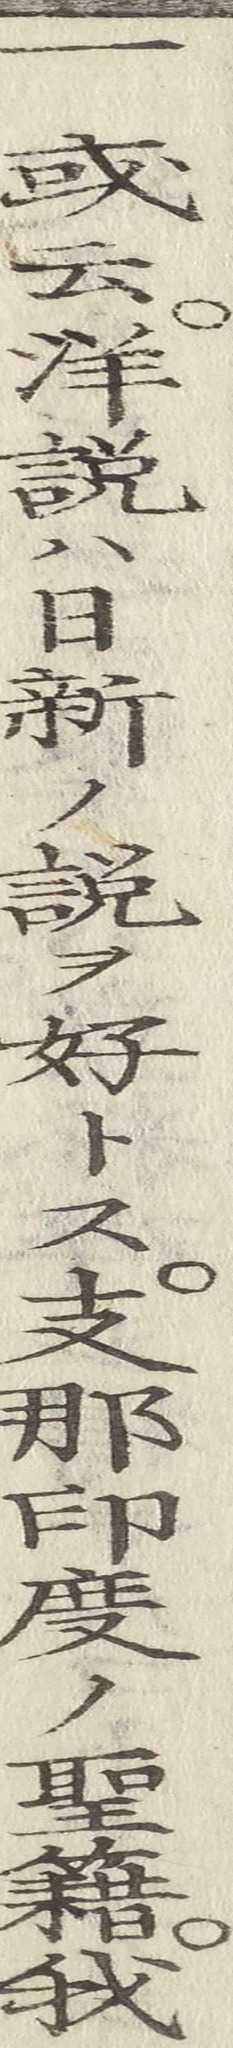一或云。洋説ハ日新ノ説ヲ好トス。支那印度ノ聖籍。我
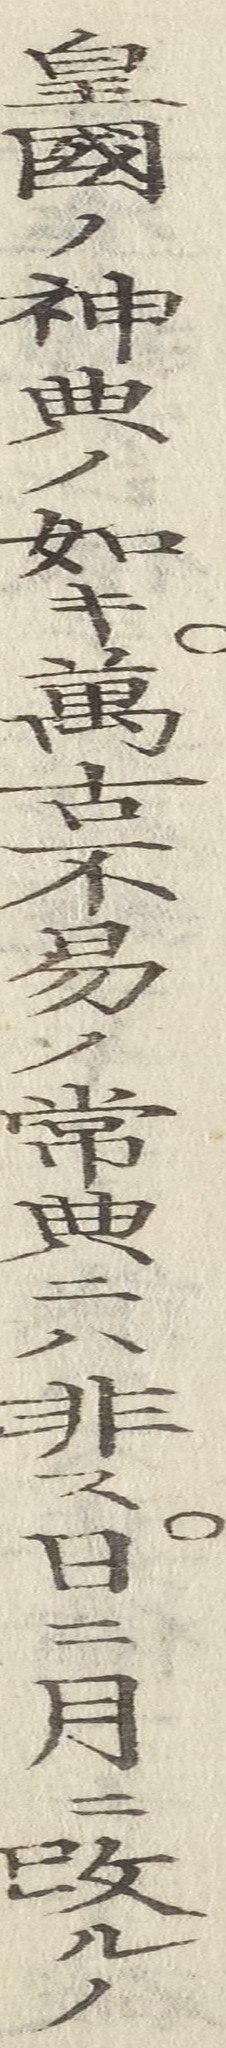皇国ノ神典ノ如キ。万古不易ノ常典ニハ非ス。日ニ月ニ改ルノ
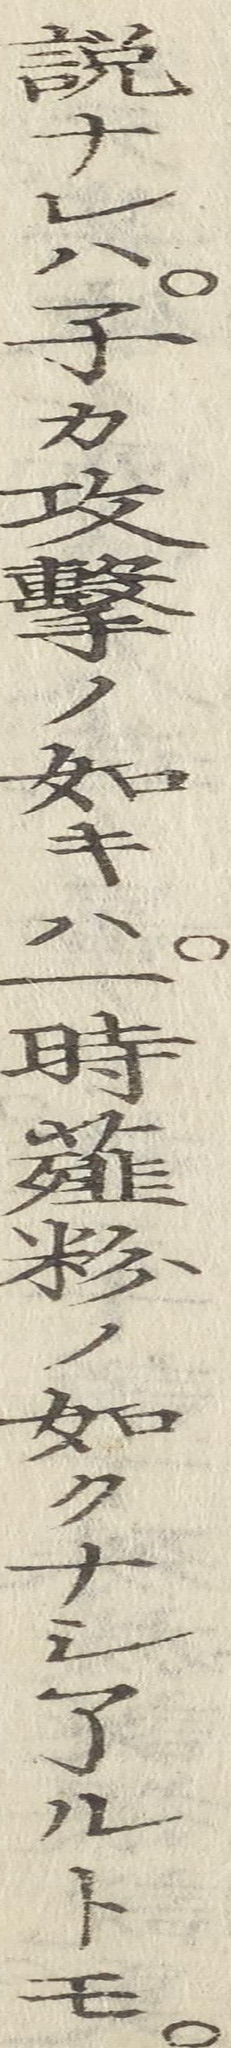説ナレハ。子カ攻撃ノ如キハ。一時薤粉ノ如クナシ了ルトモ。
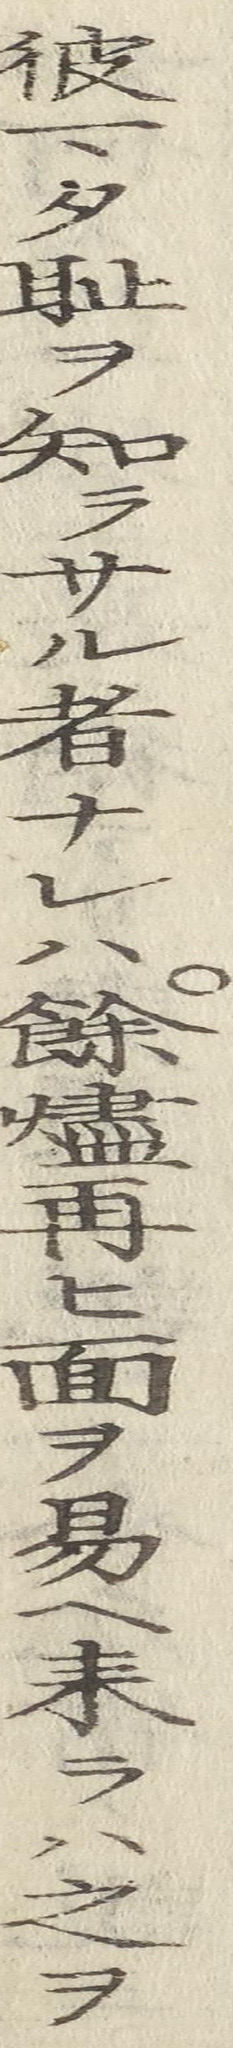彼マタ恥ヲ知ラサル者ナレハ。余燼再ヒ面ヲ易ヘ来ラハ之ヲ

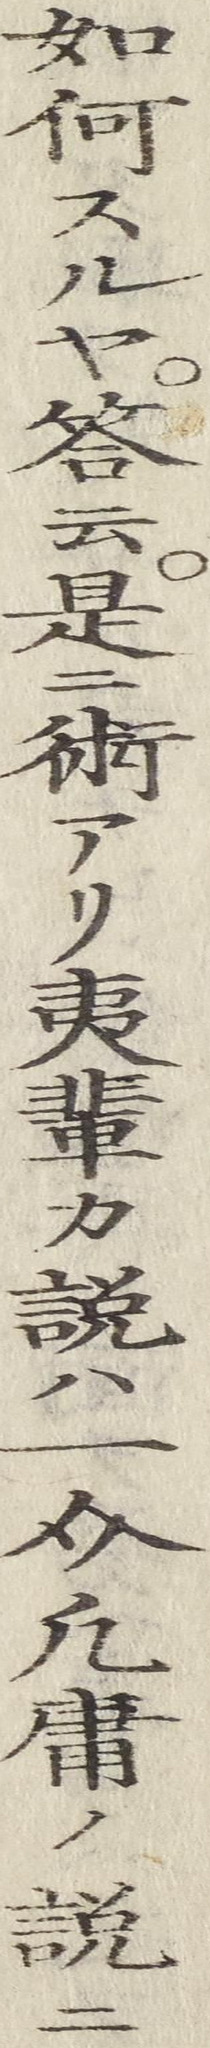如何スルヤ。答云。是ニ術アリ夷輩カ説ハ一介凡庸ノ説ニ
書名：護法新論　二編　上
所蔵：東京大学地震研究所図書室 Earthquake Research Institute Library, The University of Tokyo, JAPAN
